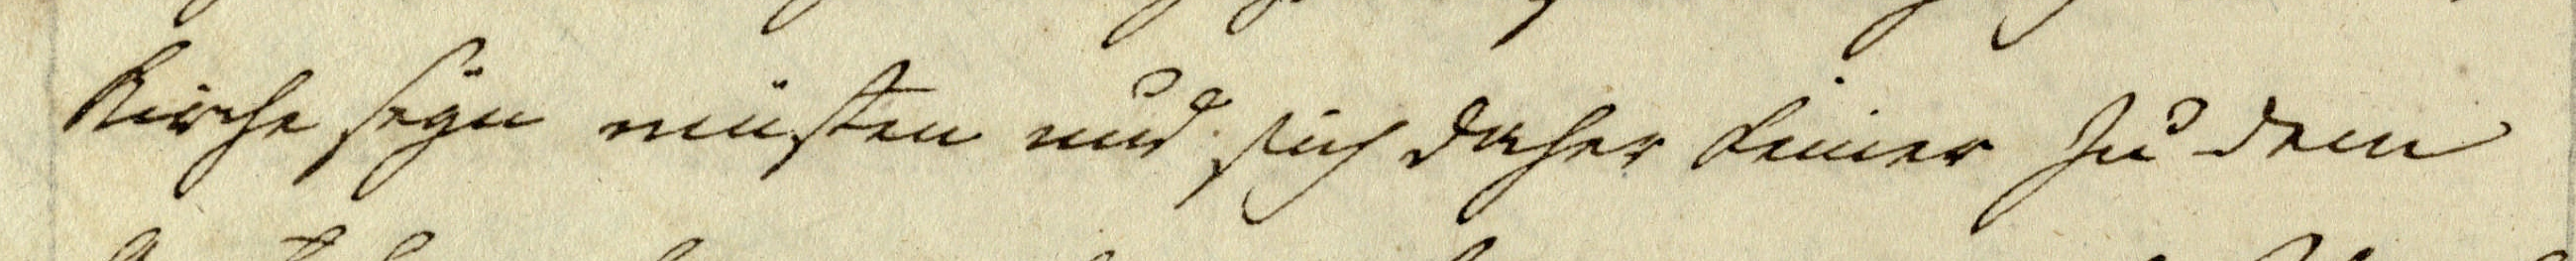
Kirche seÿn müssten und sich daher keiner zu dem
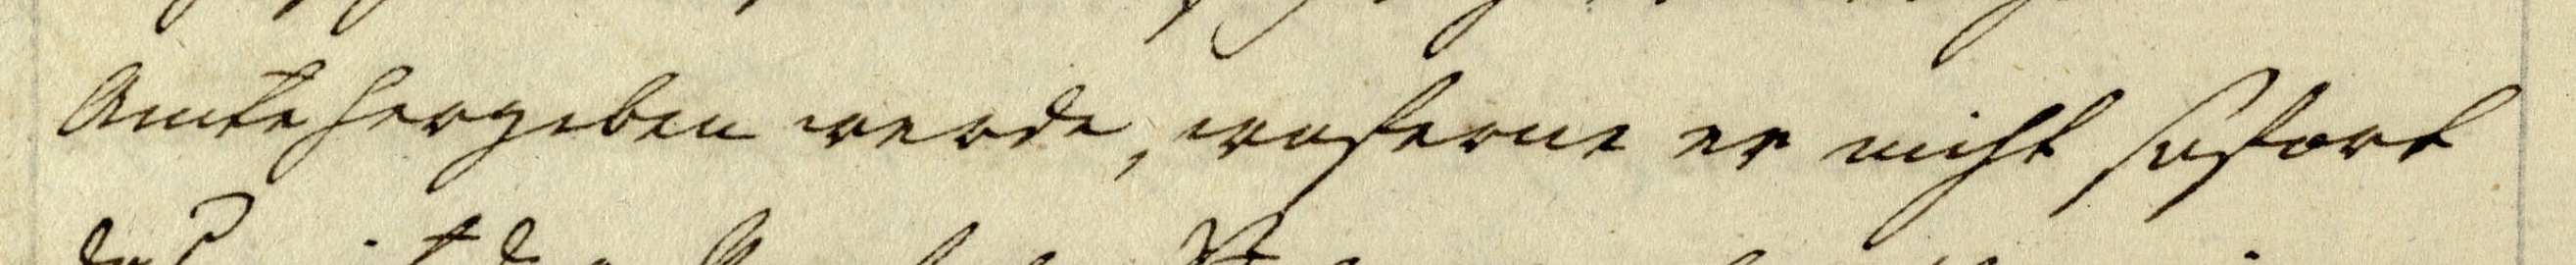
Amte hergeben werde, woferne er nicht sofort
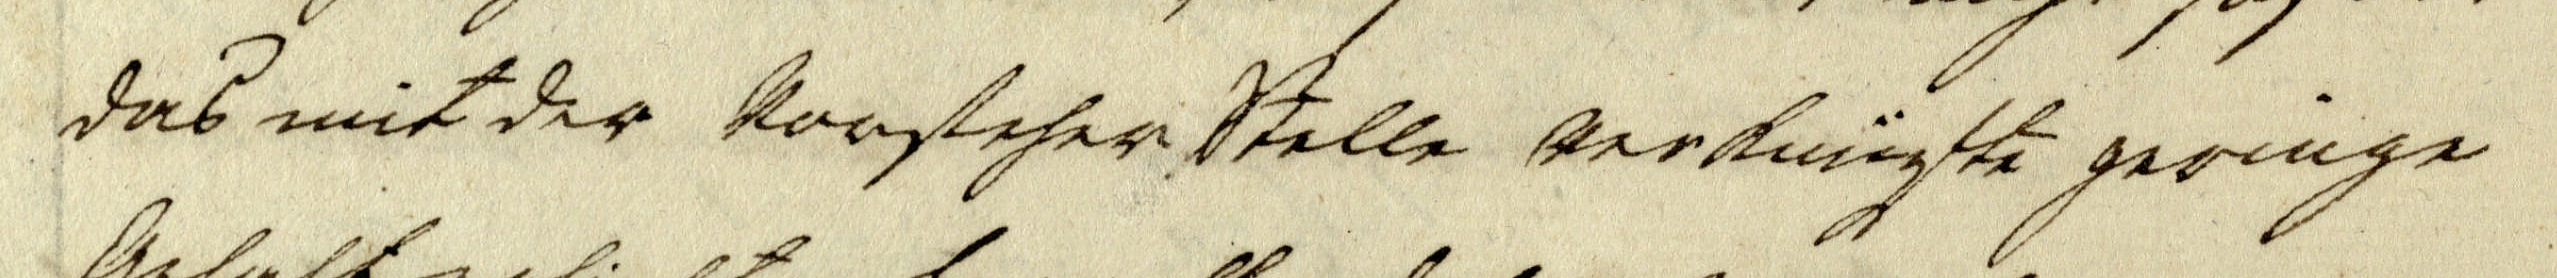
das mit der Vorsteher Stelle verknüpfte geringe
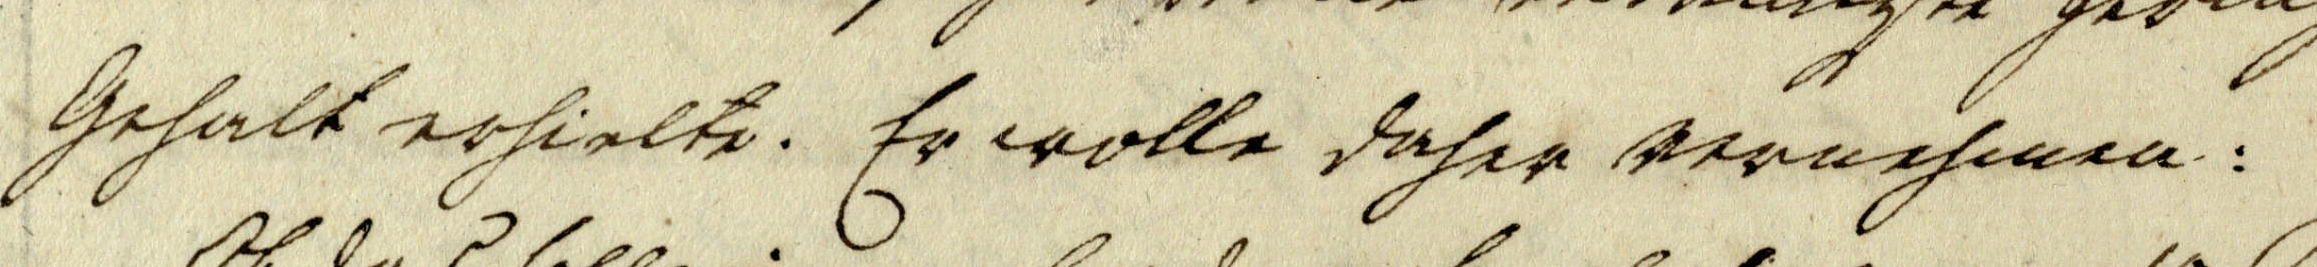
Gehalt erhielte. Er wolle daher vernehmen:
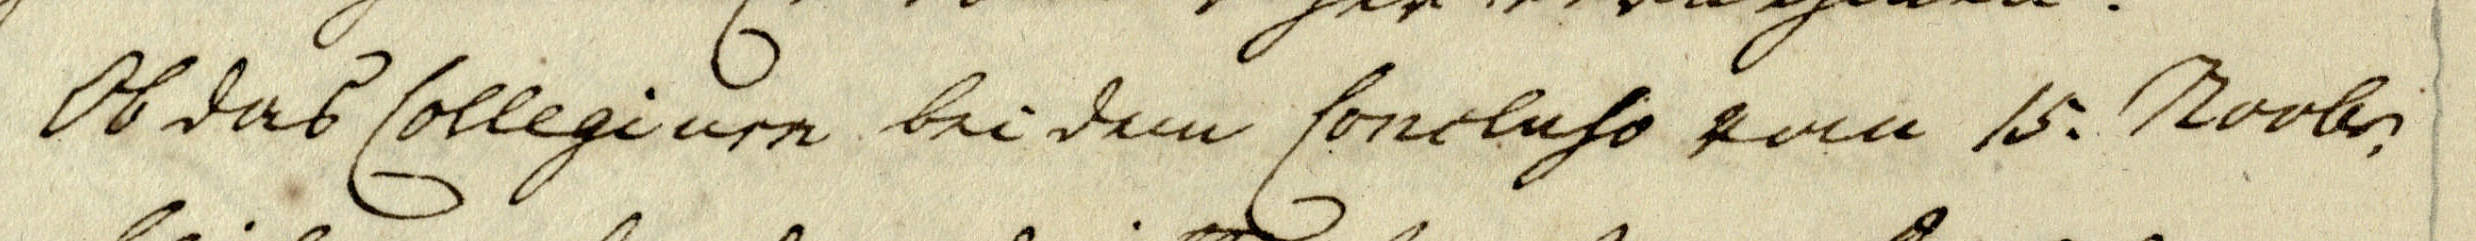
Ob das Collegium bei dem Concluso vom 15. Novbr.
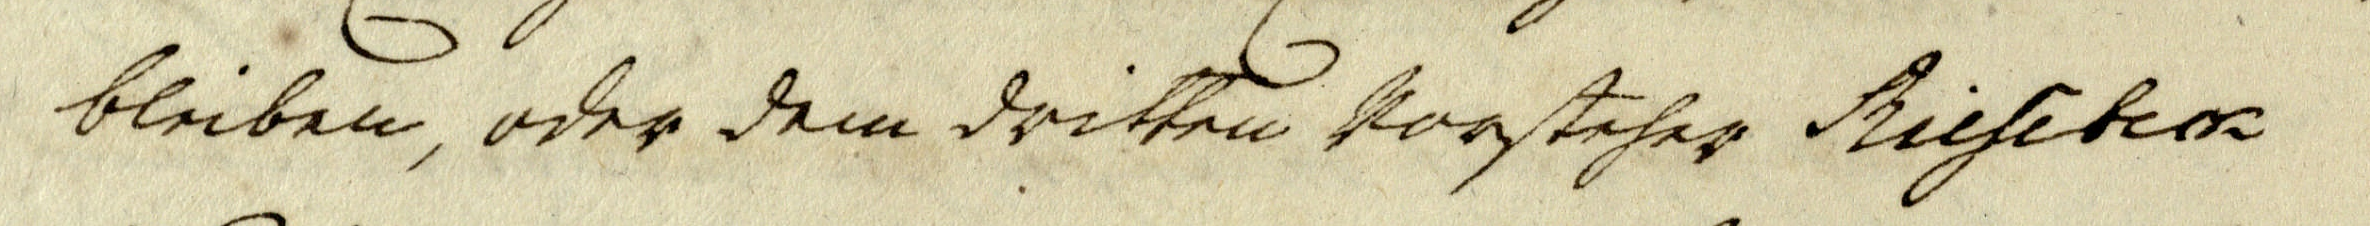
bleiben, oder dem dritten Vorsteher Riesebeck
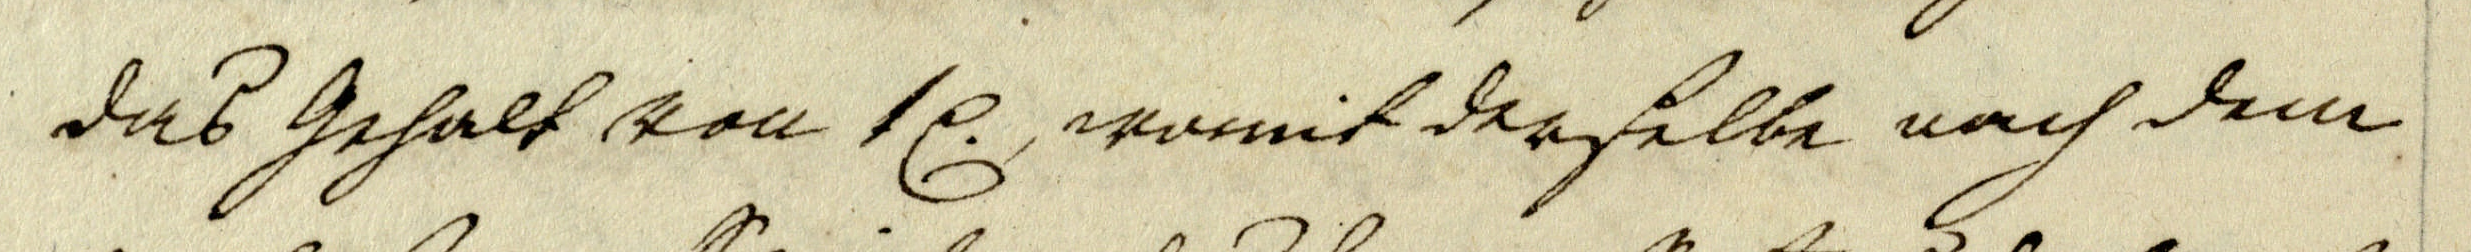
das Gehalt von 1 l, womit derselbe nach dem
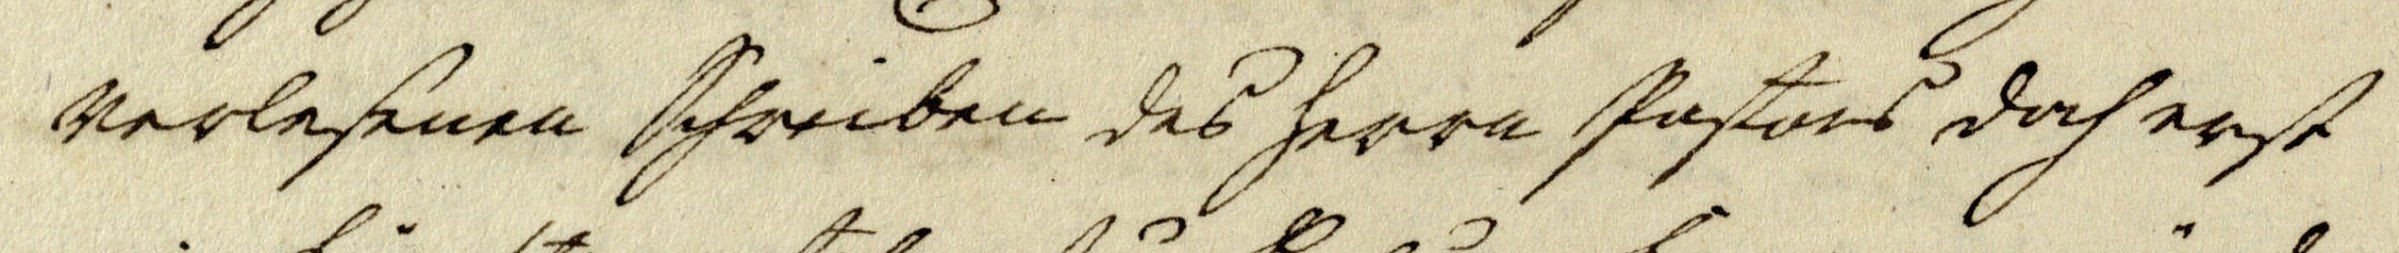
verlesenen Schreiben des Herrn Pastors doch erst
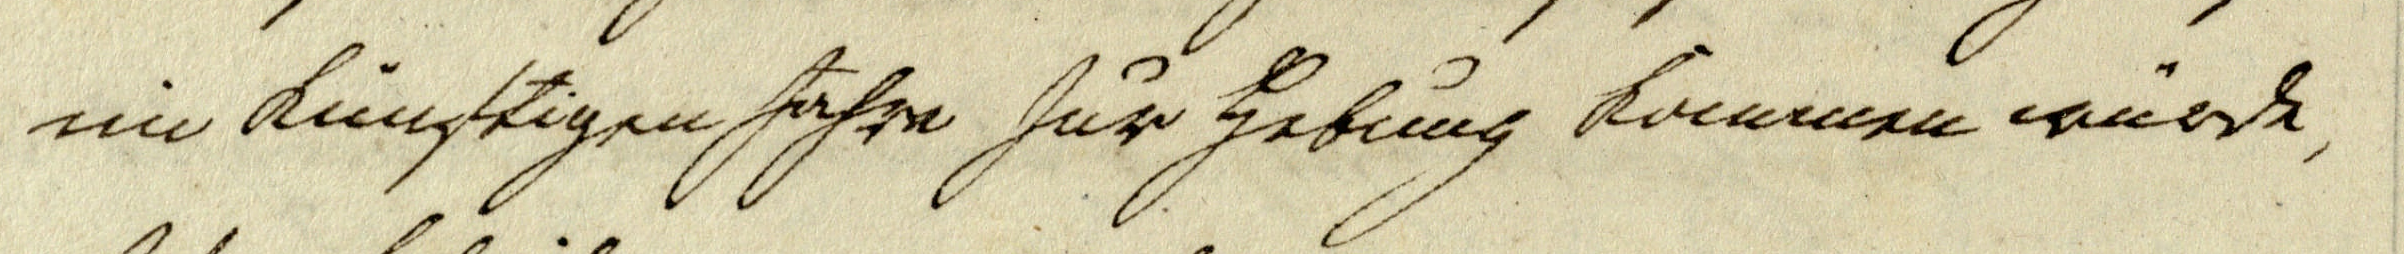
im künftigen Jahre zur Hebung kommen würde,
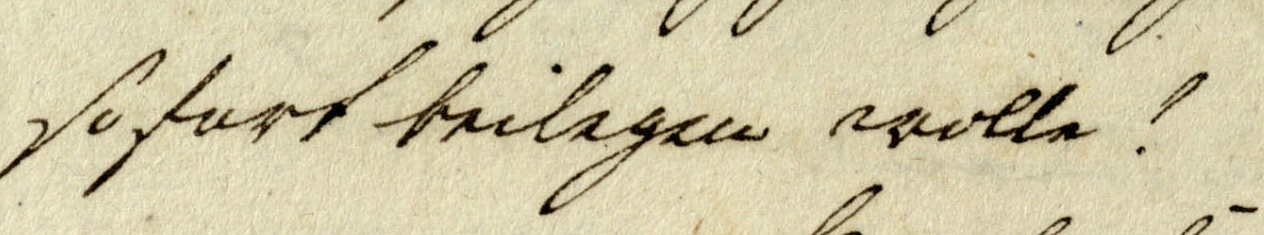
sofort beilegen wolle?
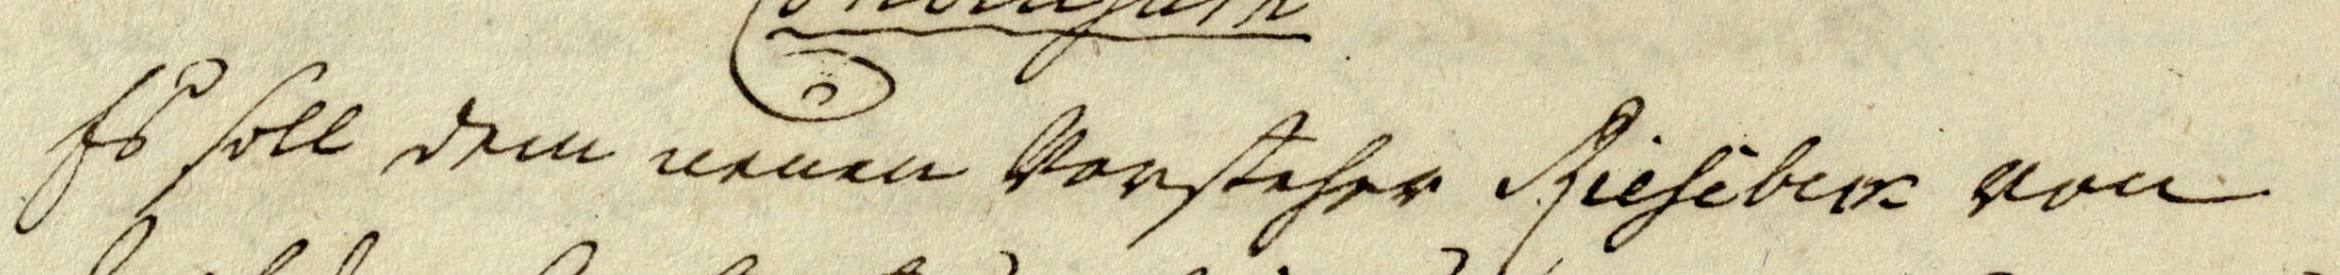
Es soll dem neuen Vorsteher Riesebeck von
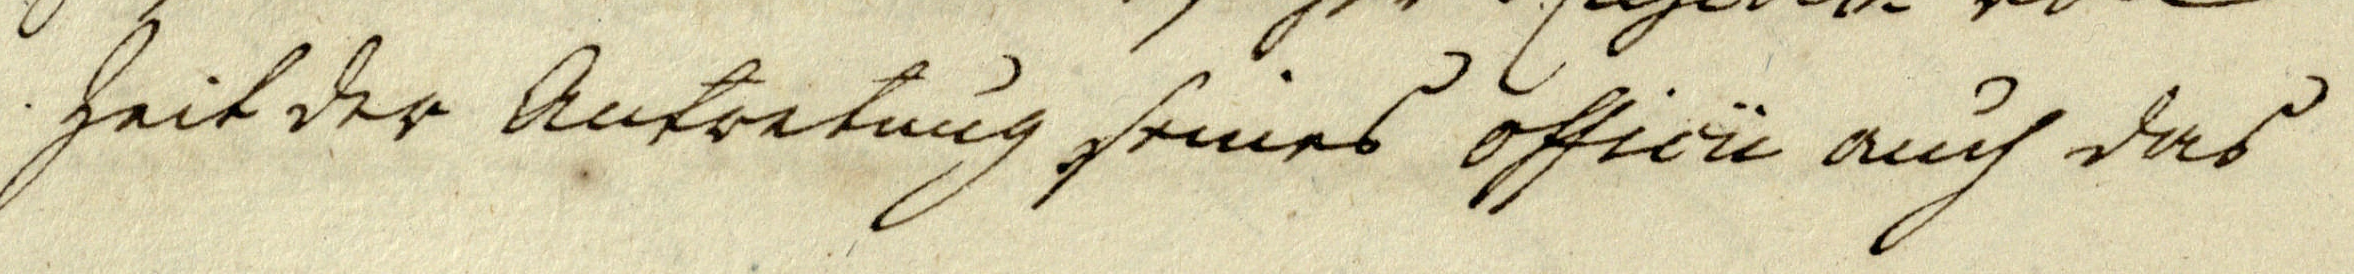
Zeit der Antretung seines officii auch das
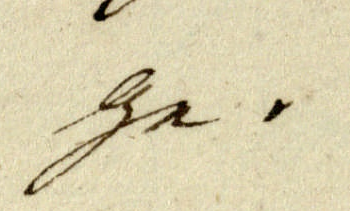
Ge¬
